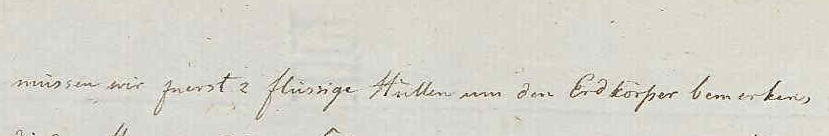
müssen wir zuerst 2 flüssige Hüllen um den Erdkörper bemerken,
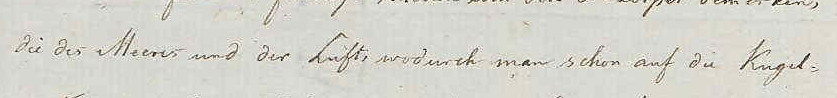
die des Meeres und der Luft, wodurch man schon auf die Kugel-
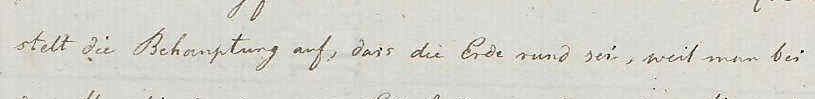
stelt die Behauptung auf, dass die Erde rund sei, weil man bei
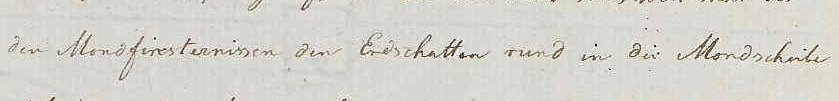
den Mondfinsternissen den Erdschatten rund in die Mondscheibe
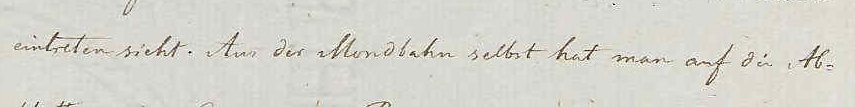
eintreten sieht. Aus der Mondbahn selbst hat man auf die Ab-
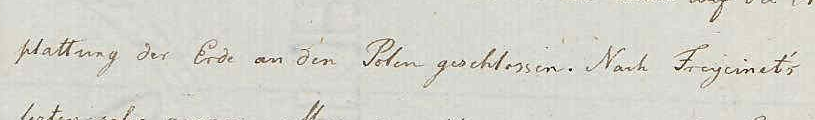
plattung der Erde an den Polen geschlossen. Nach Freycinet's
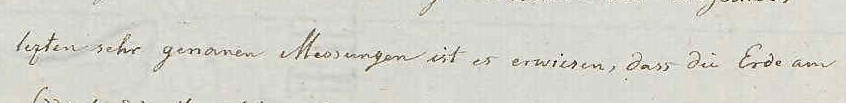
lezten sehr genauen Messungen ist es erwiesen, dass die Erde am
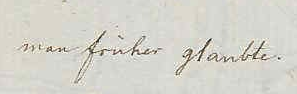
man früher glaubte.
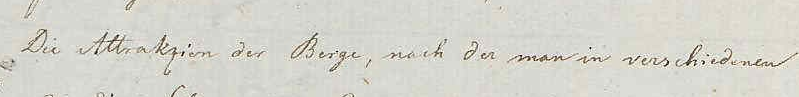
Die Attrakzion der Berge, nach der man in verschiedenen
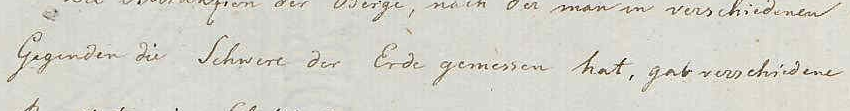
Gegenden die Schwere der Erde gemessen hat, gab verschiedene
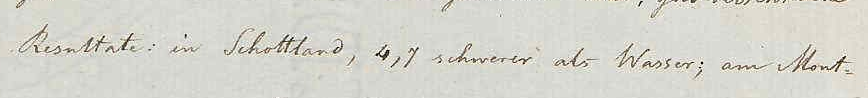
Resultate: in Schottland, 4,7 schwerer als Wasser; am Mont-
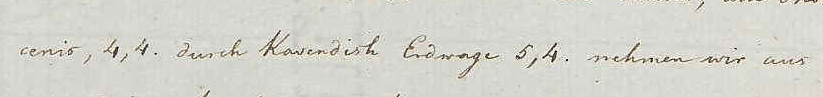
cenis, 4,4. durch Kavendish Erdwage 5,4. nehmen wir aus
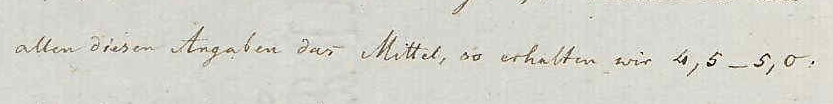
allen diesen Angaben das Mittel, so erhalten wir 4,5–5,0:
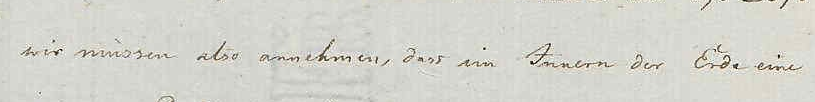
wir müssen also annehmen, dass im Innern der Erde eine
